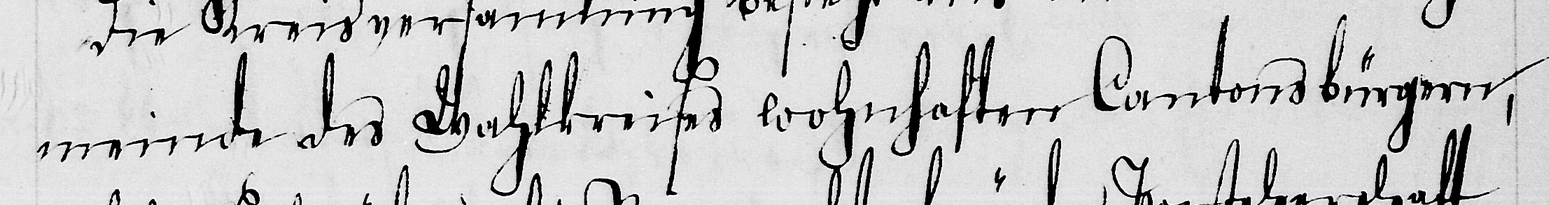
meinde des Wahlkreises wohnhaften Cantonsbürgern,
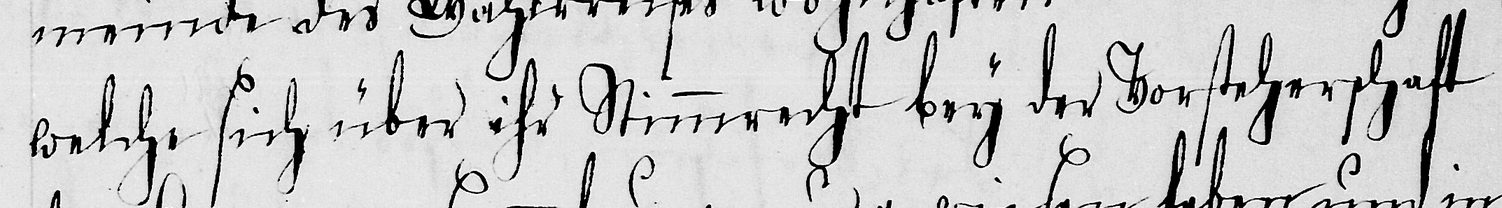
welche sich über ihr Stimmrecht bey der Vorsteherschaft
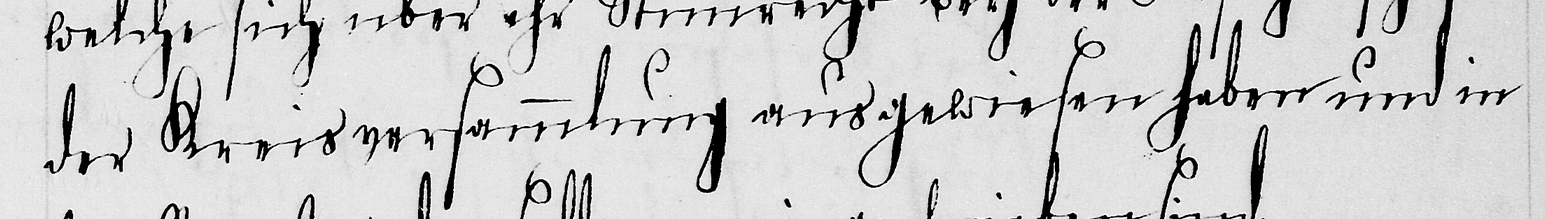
der Kreisversammlung ausgewiesen haben und in
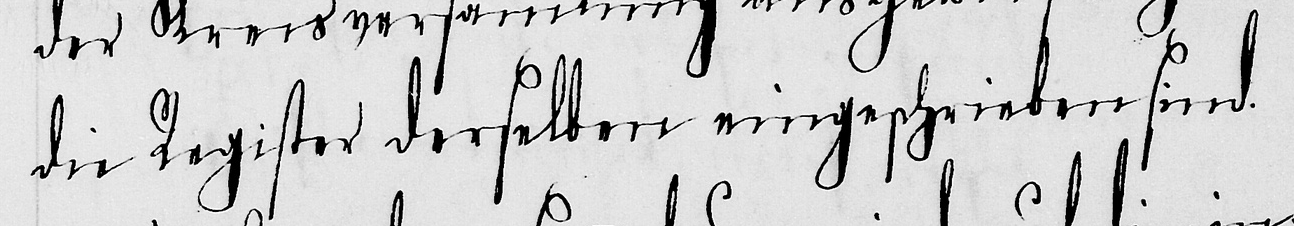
die Register derselben eingeschrieben sind.
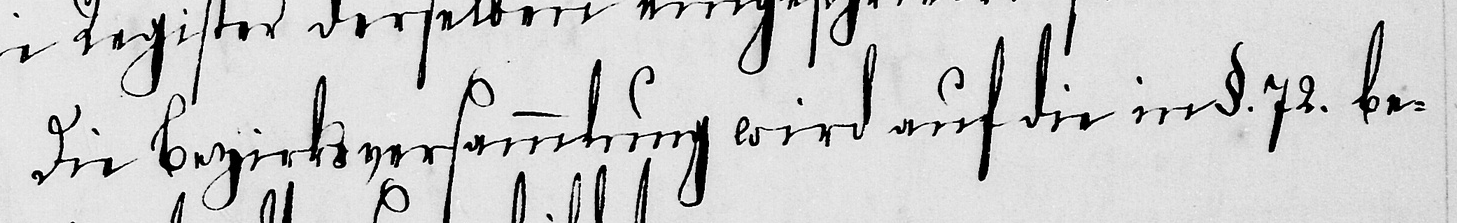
Die Bezirksversammlung wird auf die in §. 72. be¬
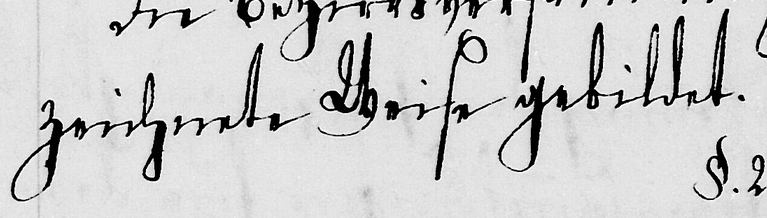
zeichnete Weise gebildet.
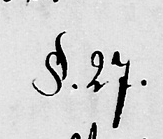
§. 27.
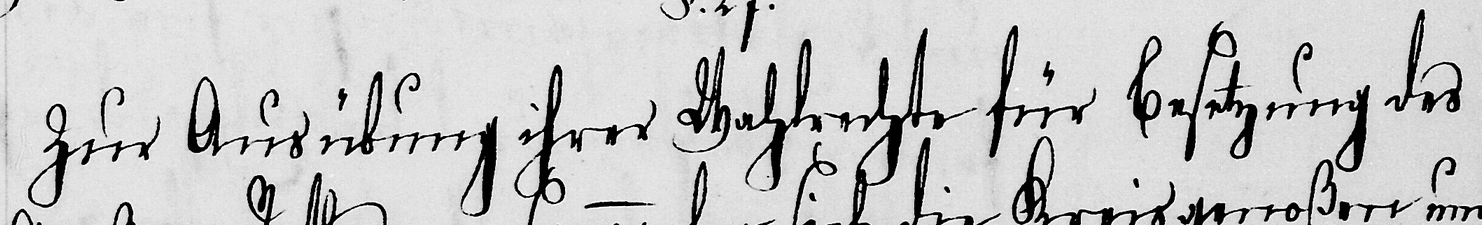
Zur Ausübung ihrer Wahlrechte für Besetzung des
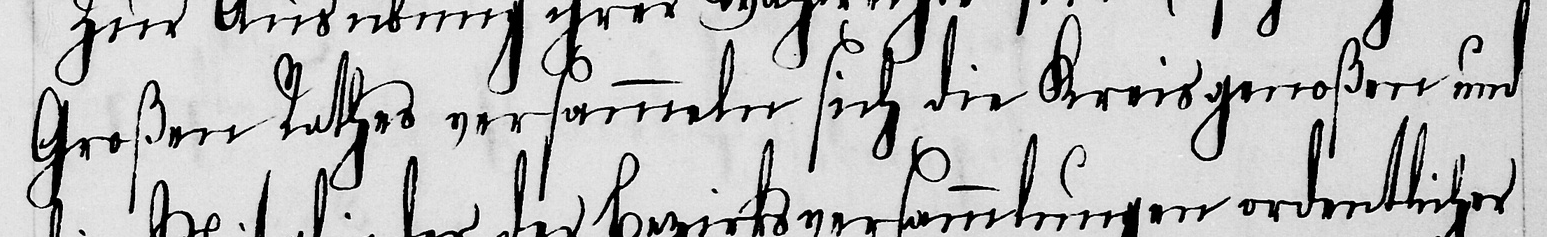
Großen Rathes versammeln sich die Kreisgenoßen und
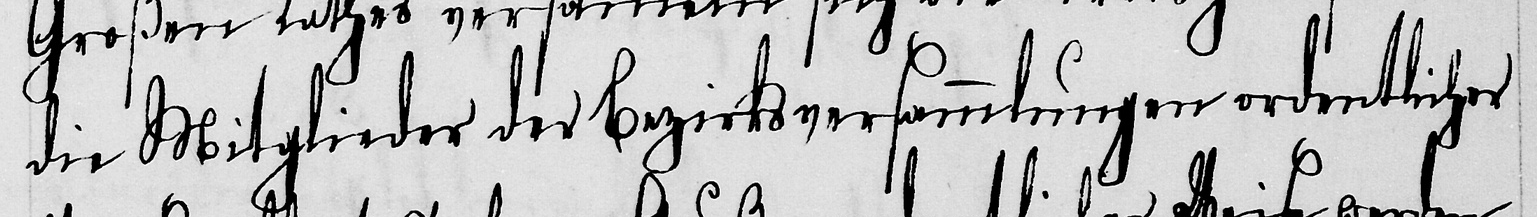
die Mitglieder der Bezirksversammlung ordentlicher
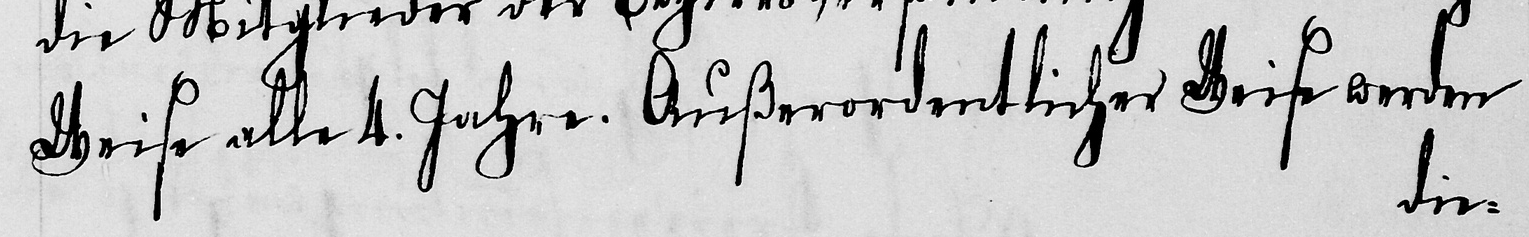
Weise alle 4. Jahre. Außerordentlicher Weise werden
